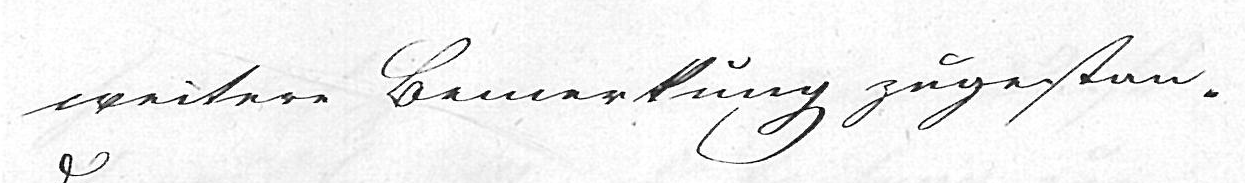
weitere Bemerkung zugestan-
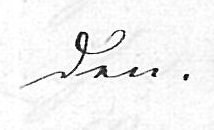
den.
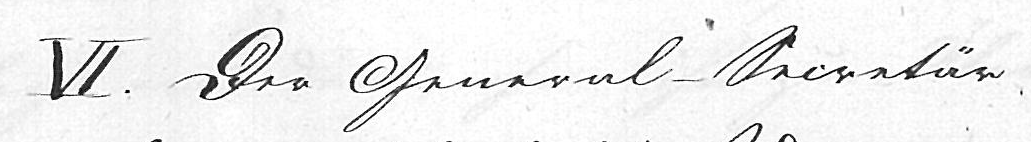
VI. Der General-Secretär
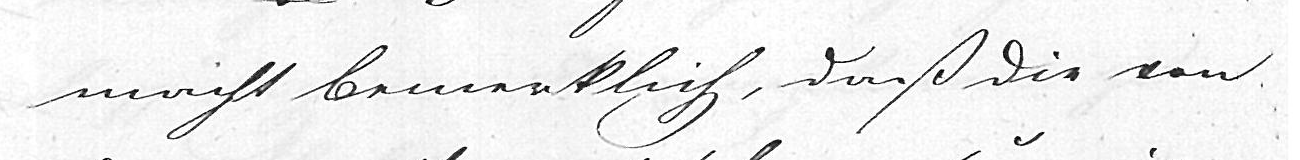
macht bemerklich, daß die von
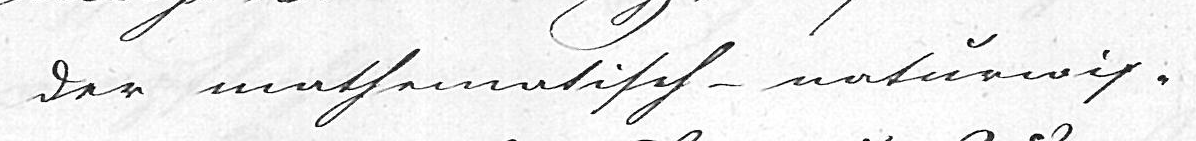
der mathematisch-naturwis-
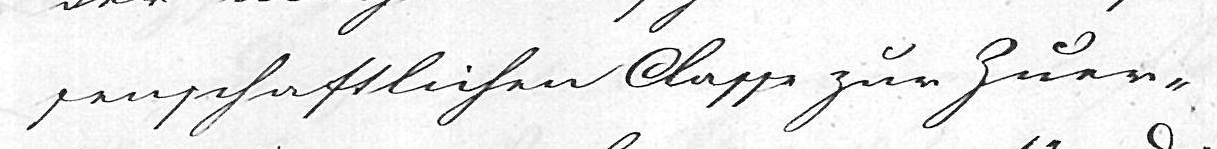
senschaftlichen Classe zur Zuer-
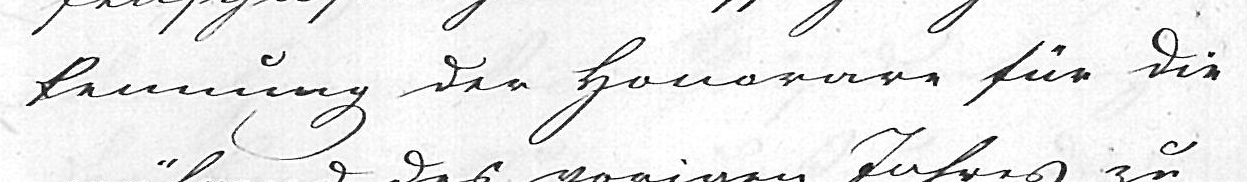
kennung der Honorare für die
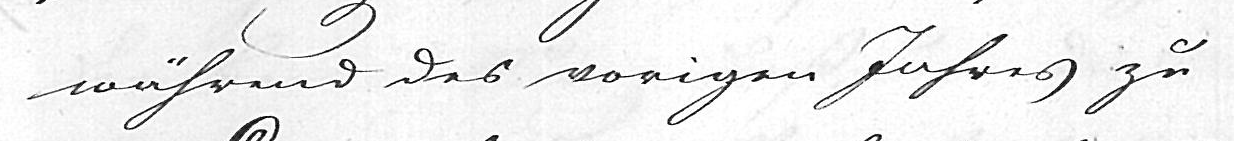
während des vorigen Jahres zu
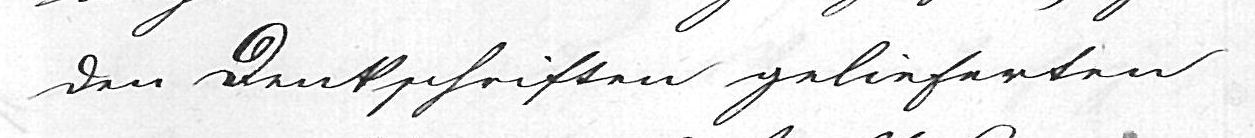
den Denkschriften gelieferten
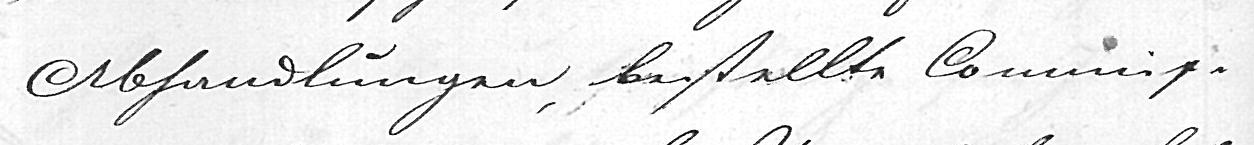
Abhandlungen, bestellte Commis-
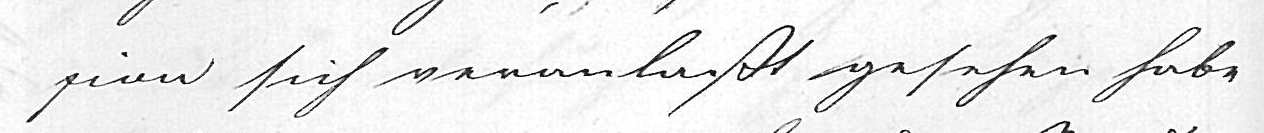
sion sich veranlaßte gesehen habe
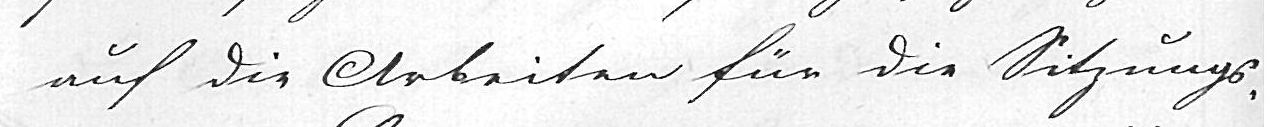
auf die Arbeiten für die Sitzungs-
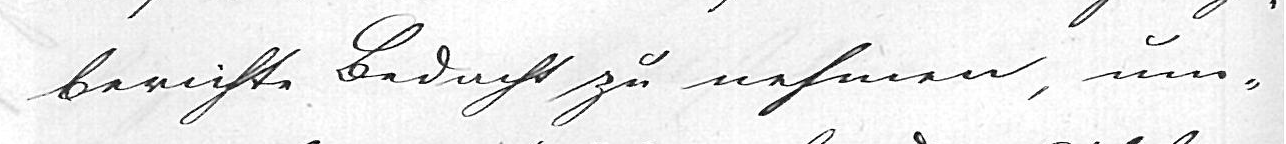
berichte Bedacht zu nehmen, um-
